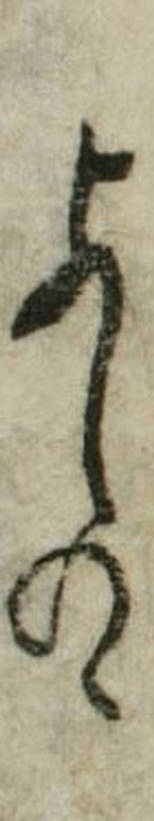よしのゝ
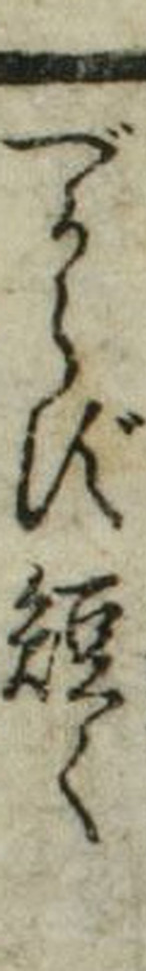べからず短く
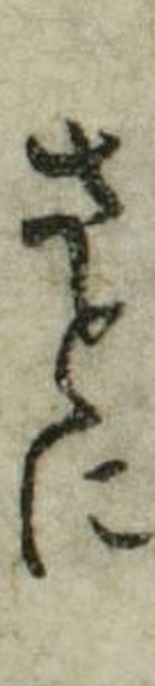さとに
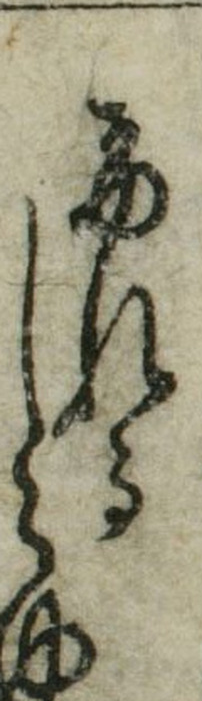ふれる
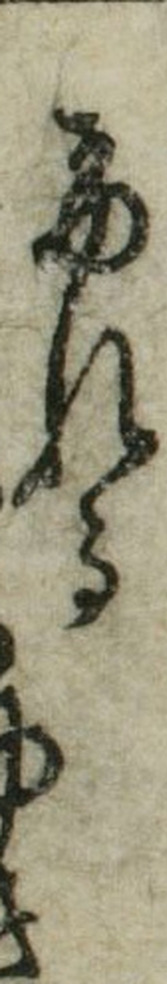ふれる
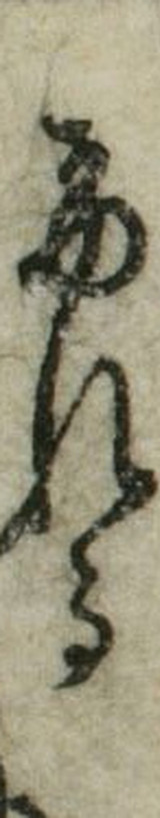ふれる

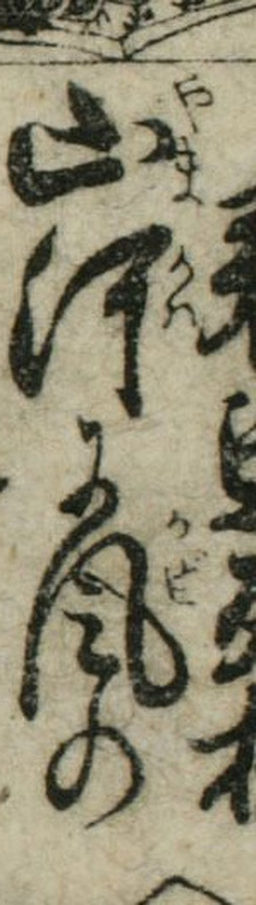山河に風の
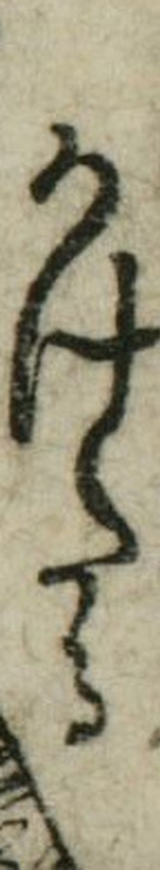かけたる
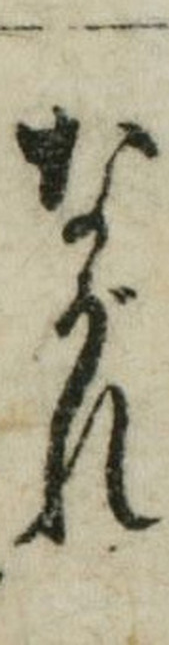ながれ
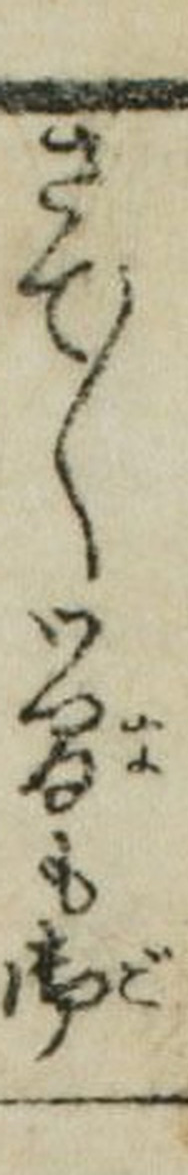さて〳〵御間も御
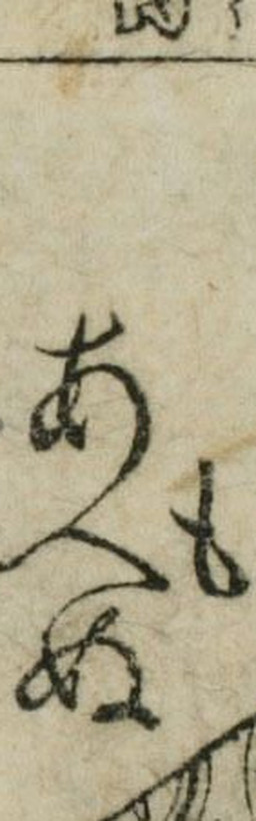あへぬ
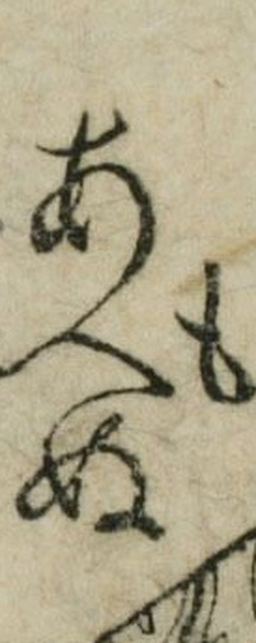あへぬ
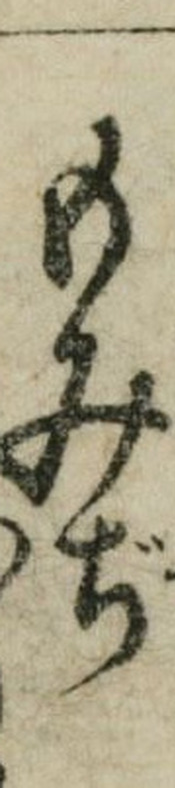もみぢ
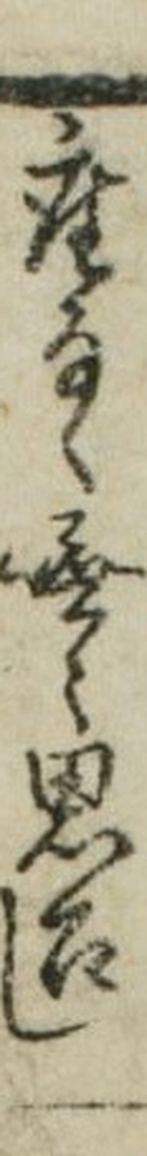座なく嘸々思召し
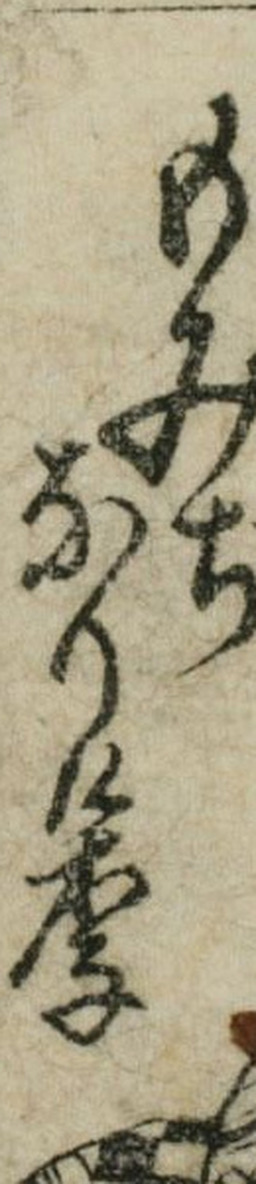なりけり
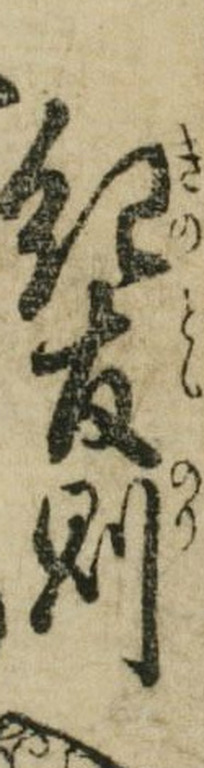紀友則
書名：百人一首
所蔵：東京学芸大学教育コンテンツアーカイブ
